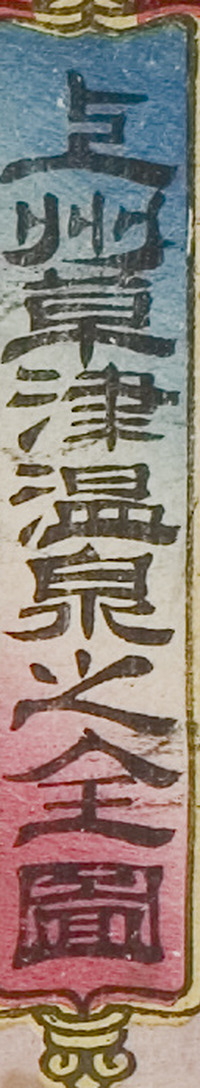上州草津温泉之全図
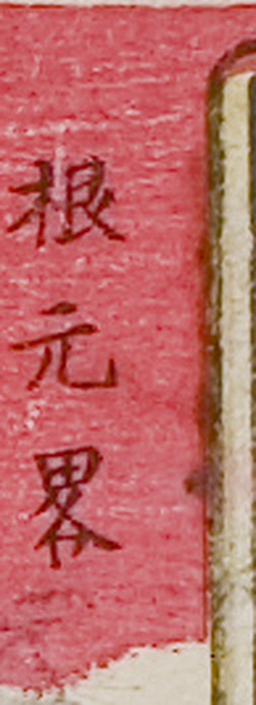根元略
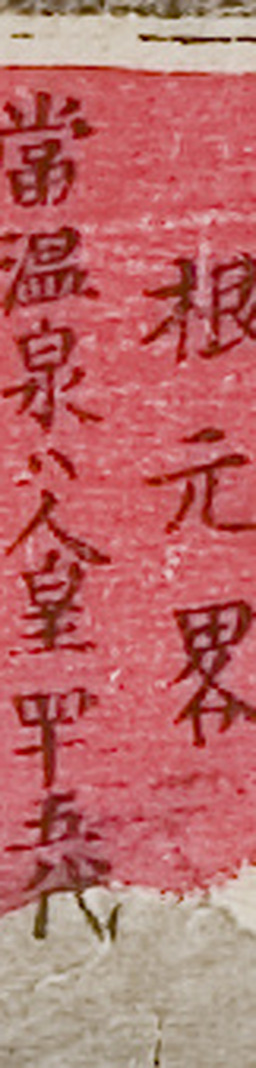当温泉ハ人皇四十五代
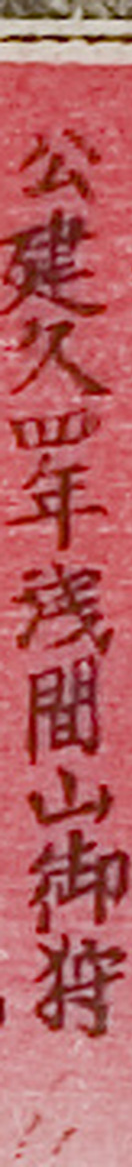公建久四年浅間山御狩
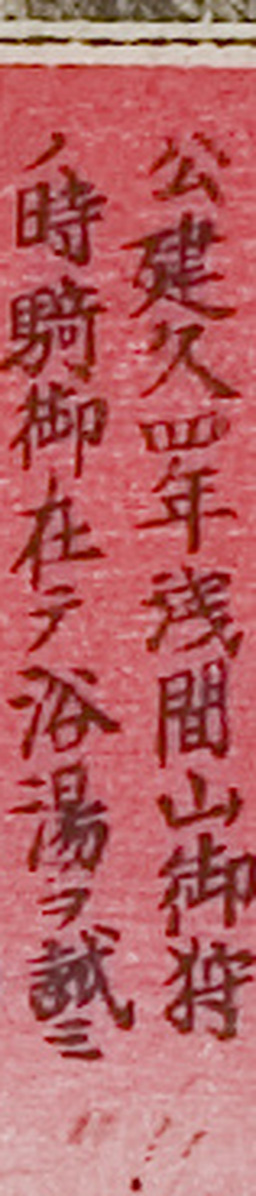ノ時騎御在テ浴湯ヲ試ミ
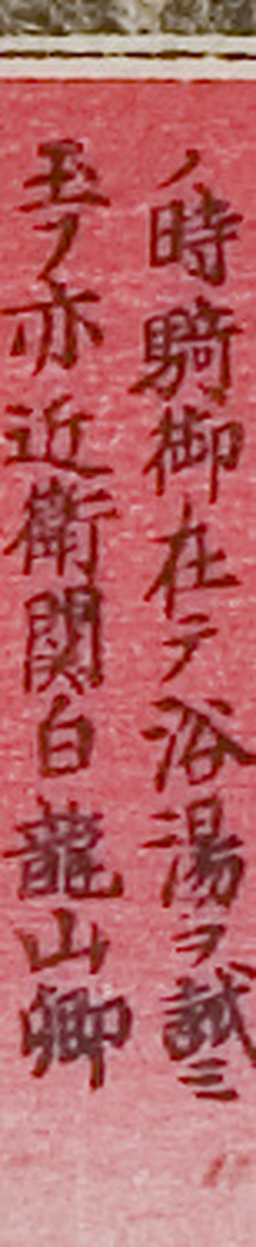玉フ亦近衛関白龍山卿
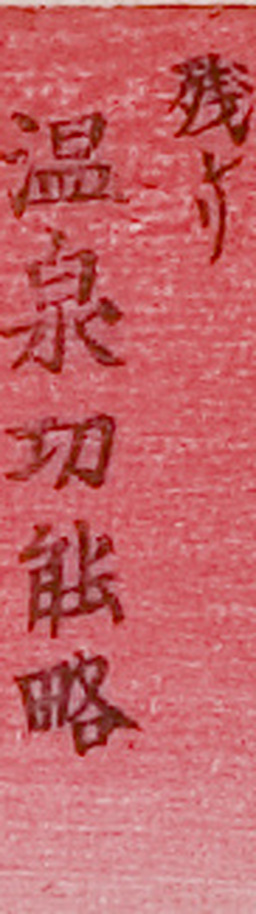温泉功能略
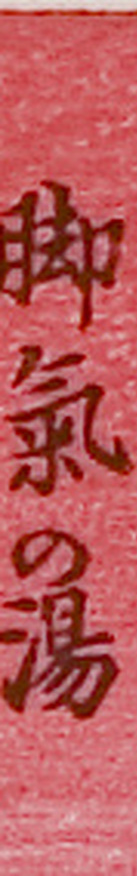脚気の湯
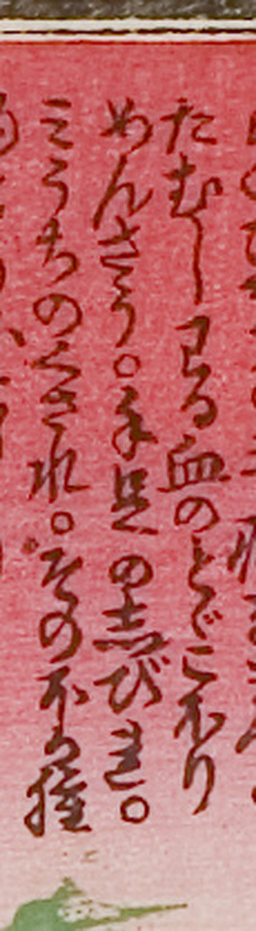めんさう○手足のしびれ○
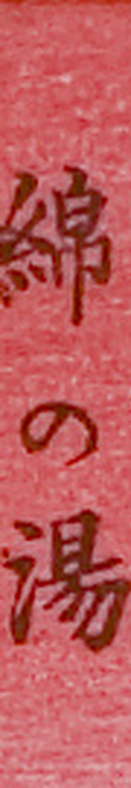綿の湯
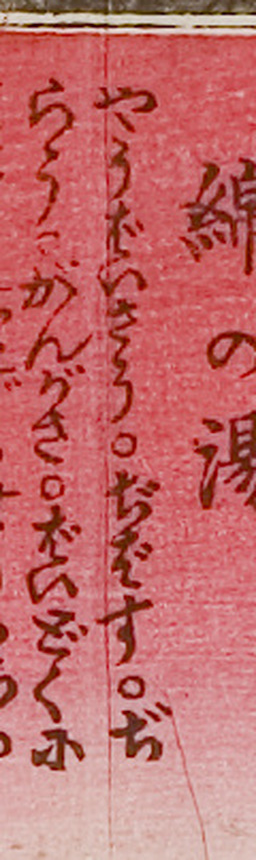やうばいさう○ぢばす○ぢ
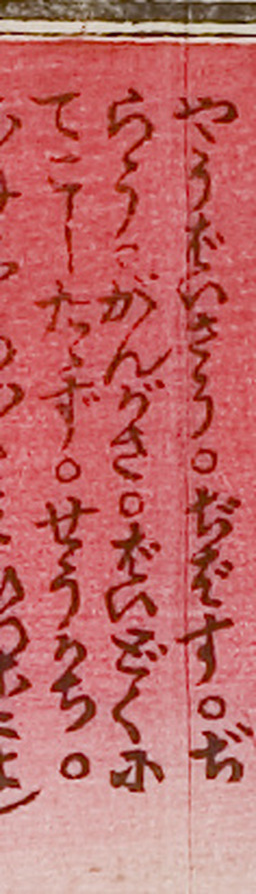らう○がんがさ○ばいどくに
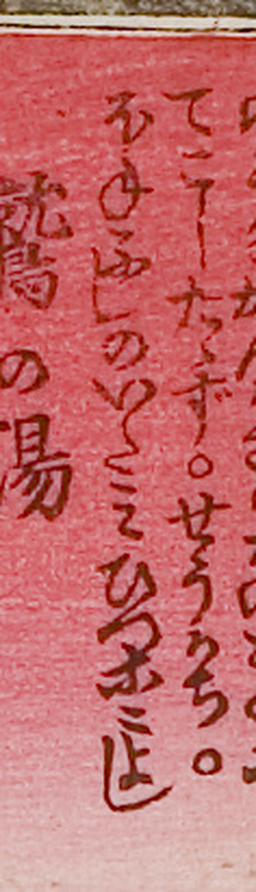ほねふしのいたみひつ等によし
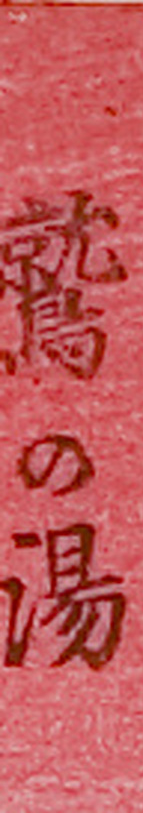鷲の湯
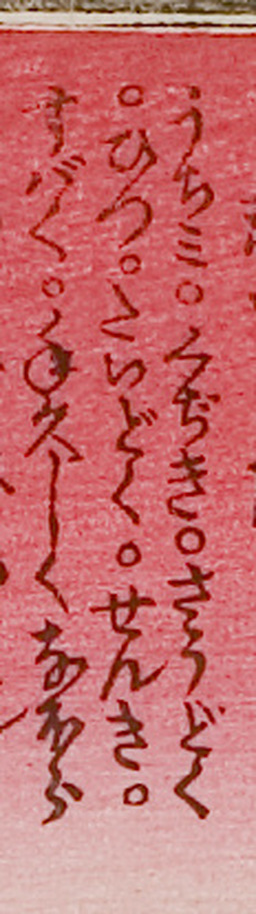○ひつ○たいどく○せんき○
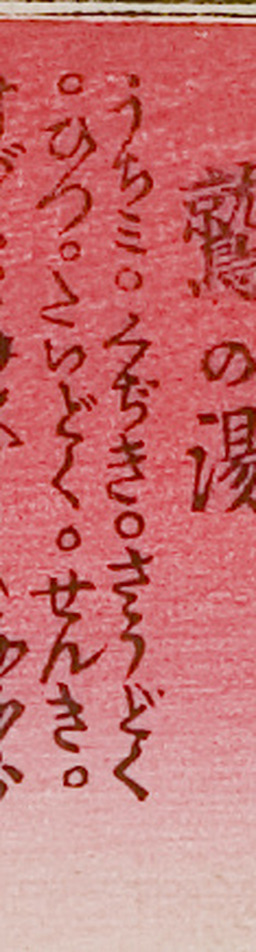うちみ○くぢき○さうどく
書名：上州草津温泉之全図
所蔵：東京大学総合図書館 General Library in the University of Tokyo, JAPAN
